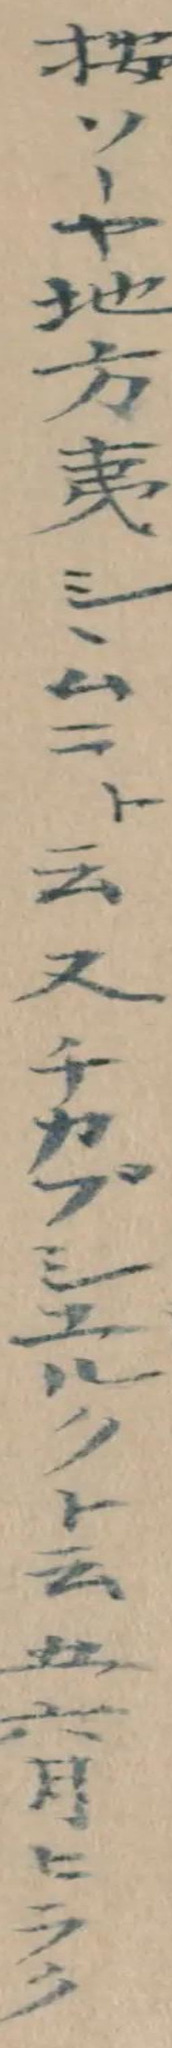按ソーヤ地方夷シヽムニト云又チカプシヱルクト云五六月ヒラク

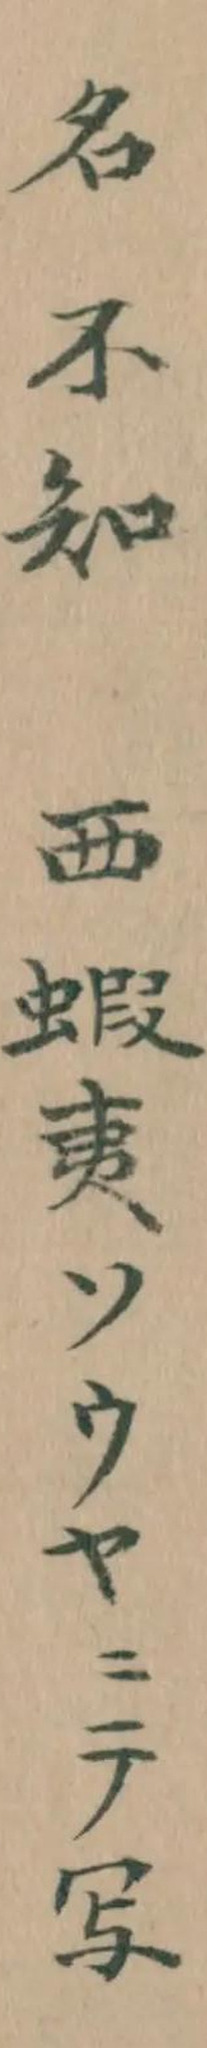名不知西蝦夷ソウヤニテ写
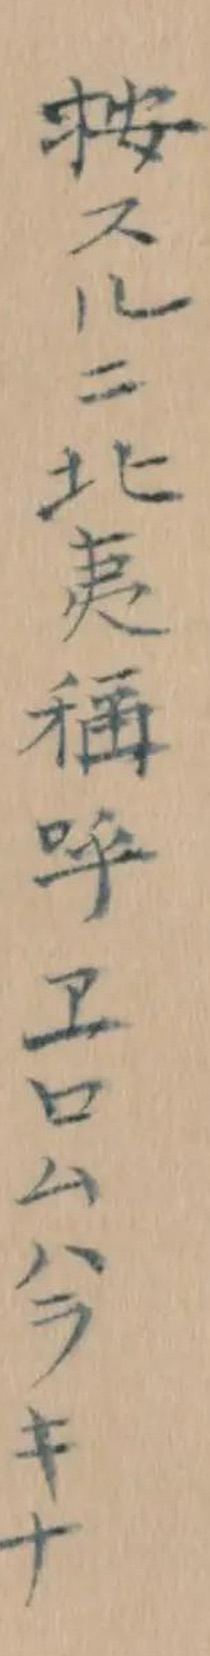按スルニ北夷称呼ヱロムハラキナ
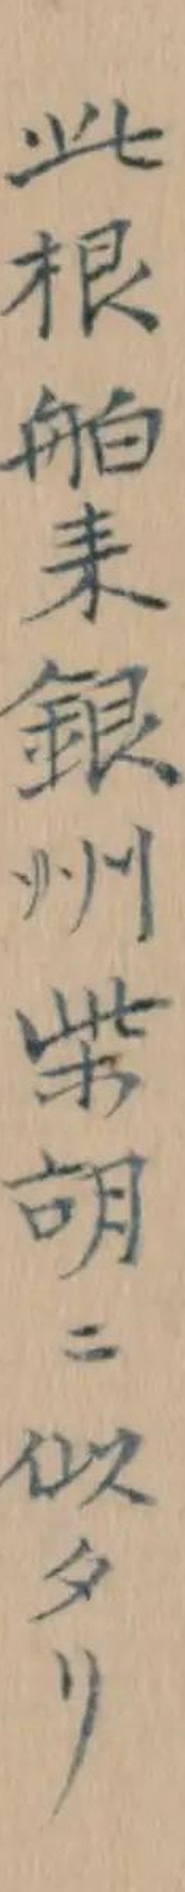此根舶来銀州柴胡ニ似タリ
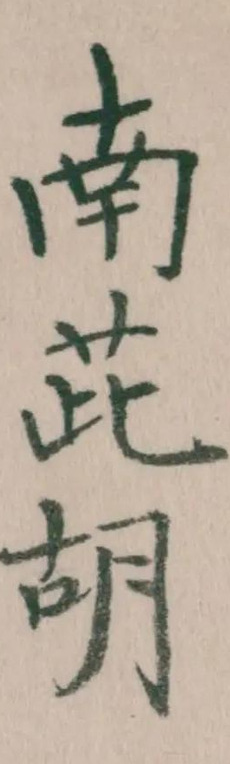南茈胡

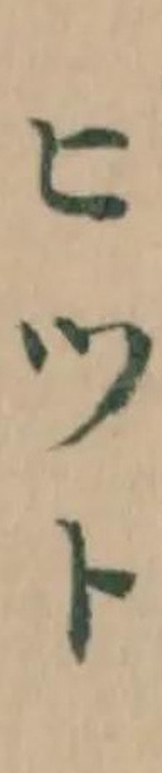ビツト
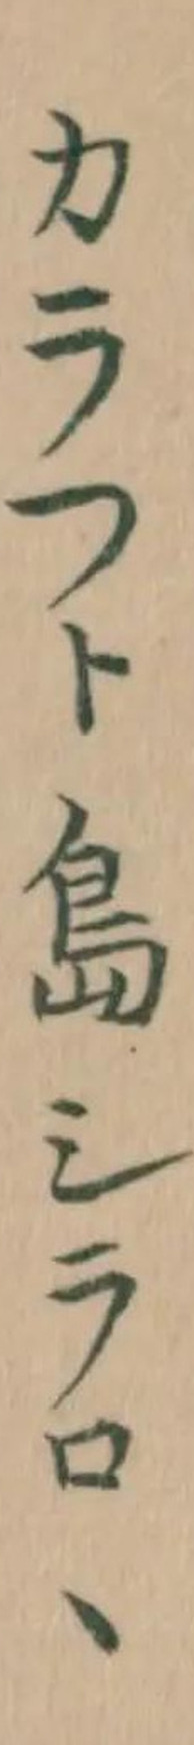カラフト島シラロヽ
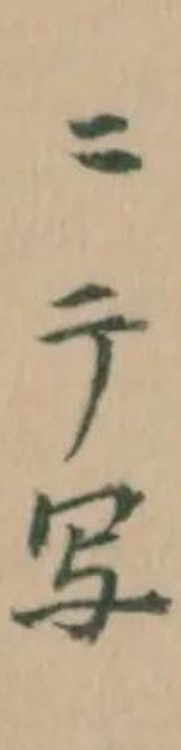ニテ写
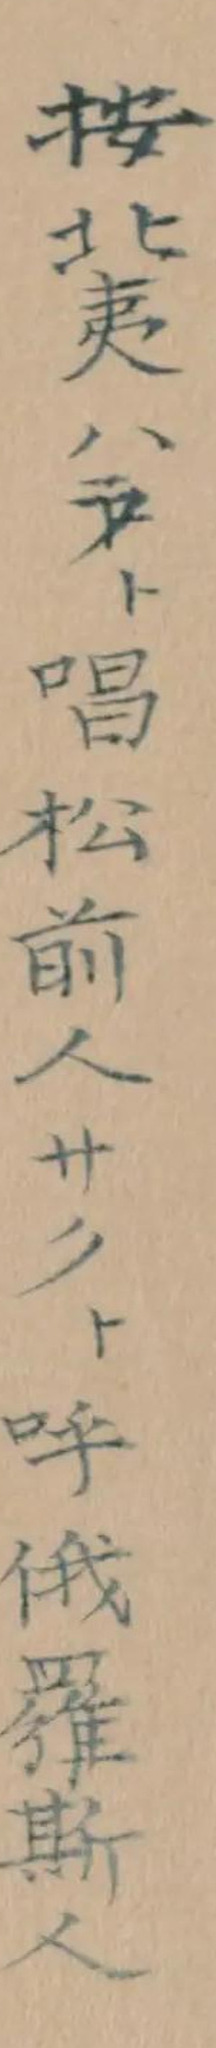按北夷ハラト唱松前人サクト呼俄羅斯人
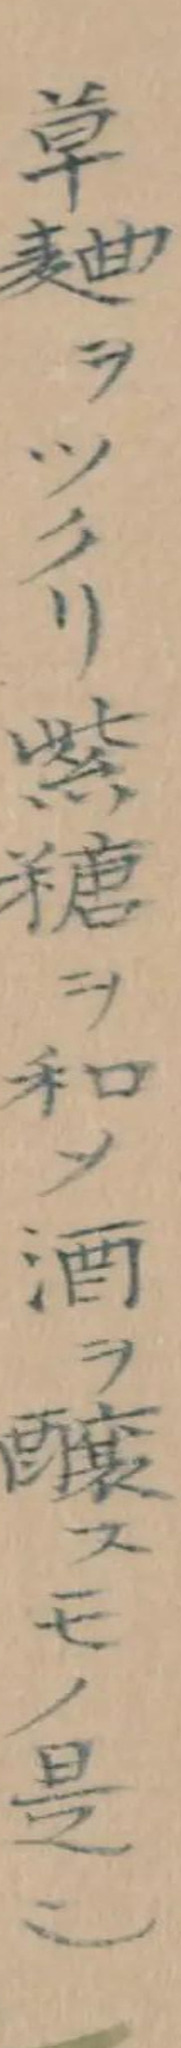草麺ヲツクリ紫糖ヲ和シテ酒ヲ醸スモノ是也
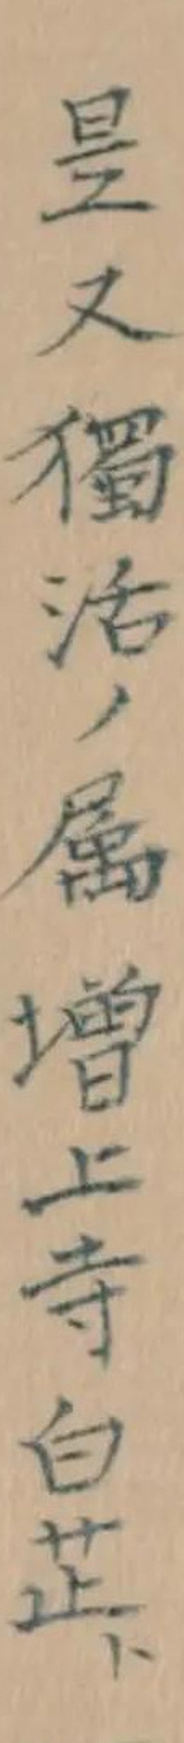是又独活ノ属増上寺白芷ト
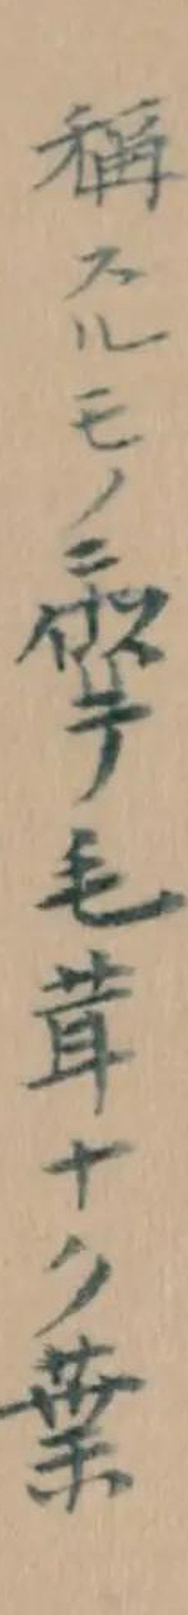称スルモノニ似テ毛茸ナク葉
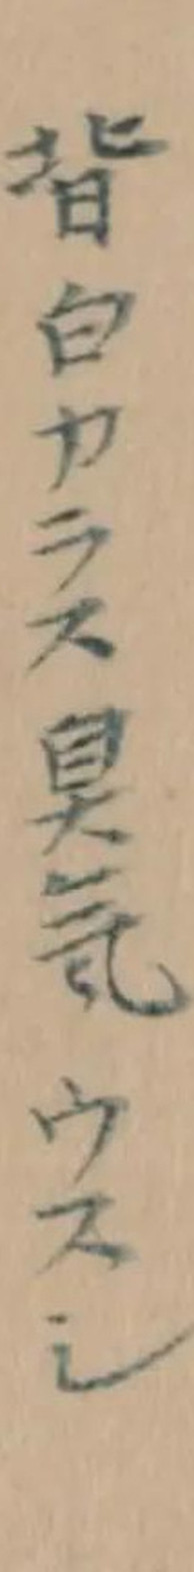背白カラス臭気ウスシ

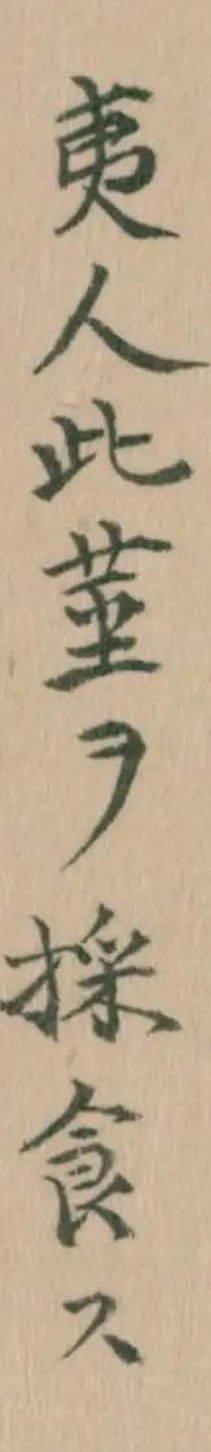夷人此菫ヲ採食ス
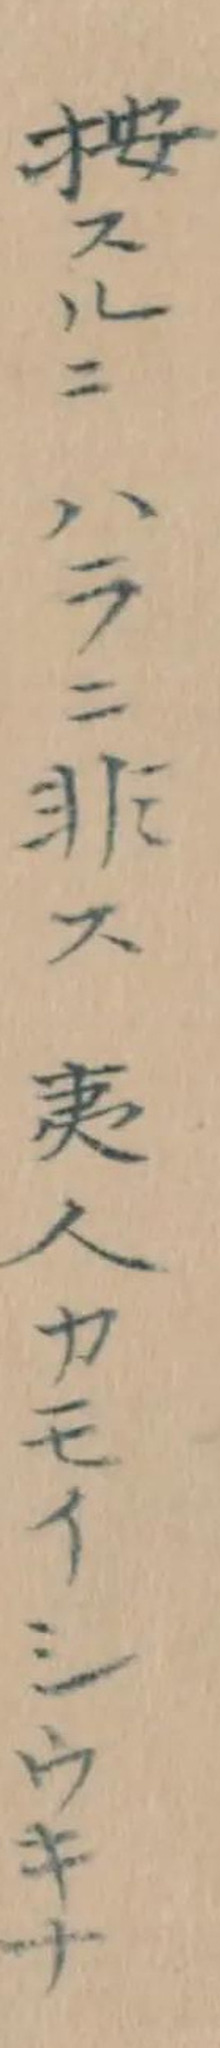案スルニハラニ非ス夷人カモイシウキナ
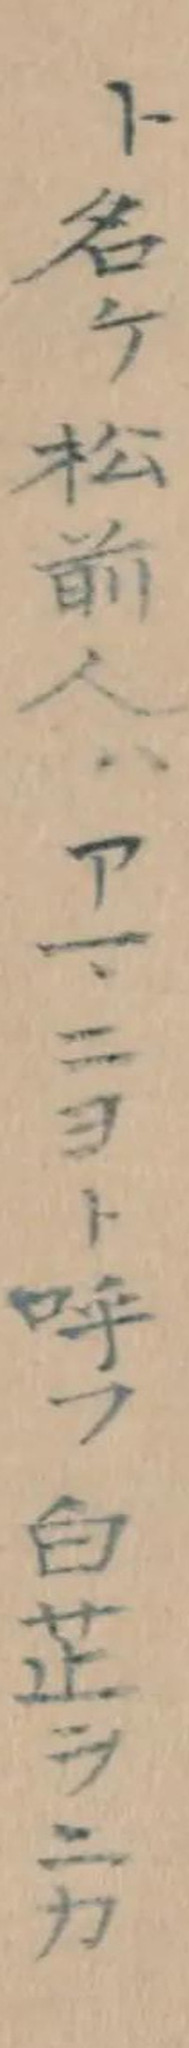ト名ケ松前人ハアマニヨト呼フ白芷ヲニカ
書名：蝦夷草木図
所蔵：国立国会図書館 National Diet Library, JAPAN
